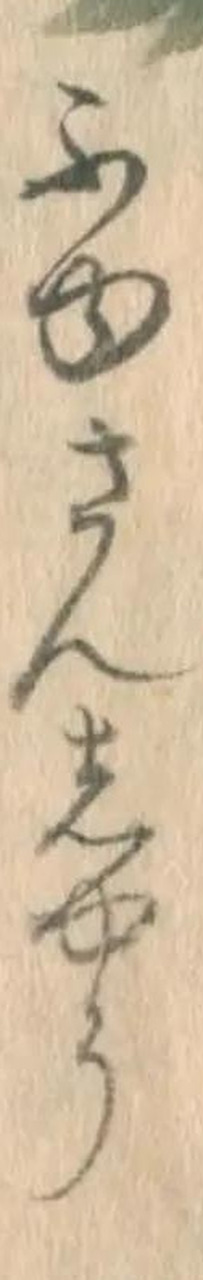ふゆさんしやう
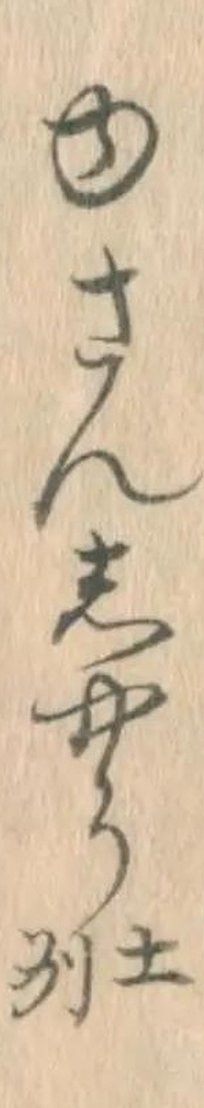ふゆさんしやう
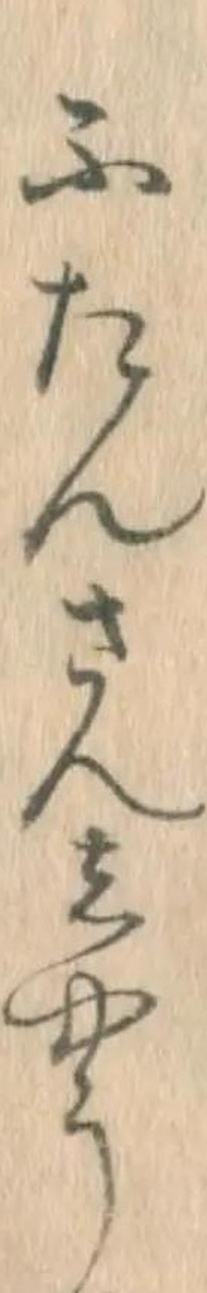ふたんさんしやう
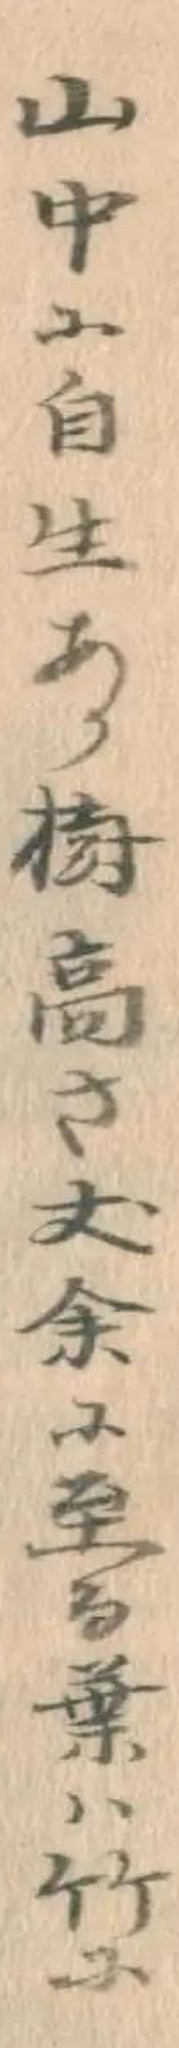山中に自生あり樹高さ丈余に至る葉は竹に
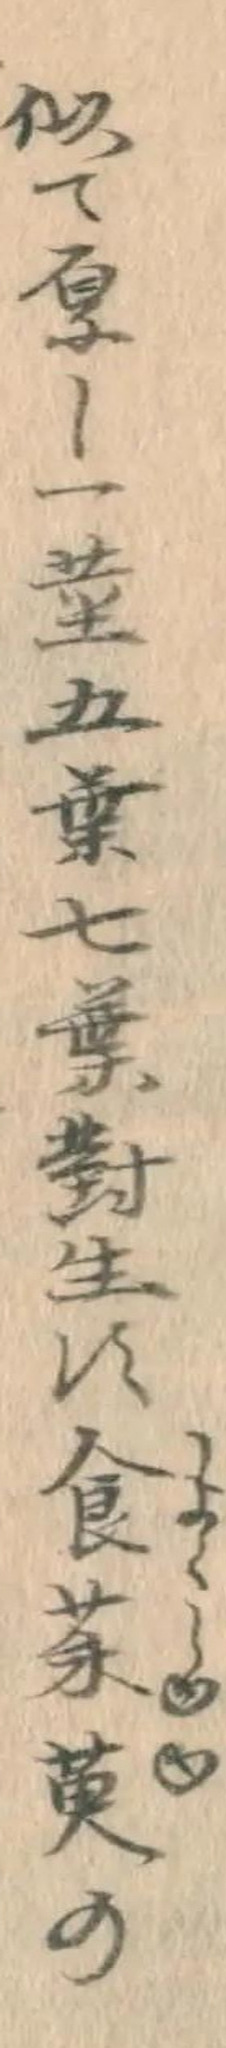似て篤一茎五葉七葉對生す食茱臾の
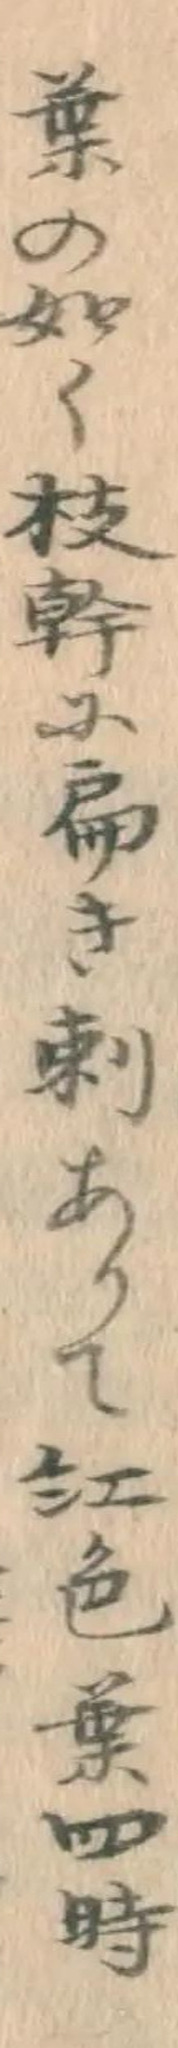葉の如く枝幹に扁き刺ありて紅色葉四時
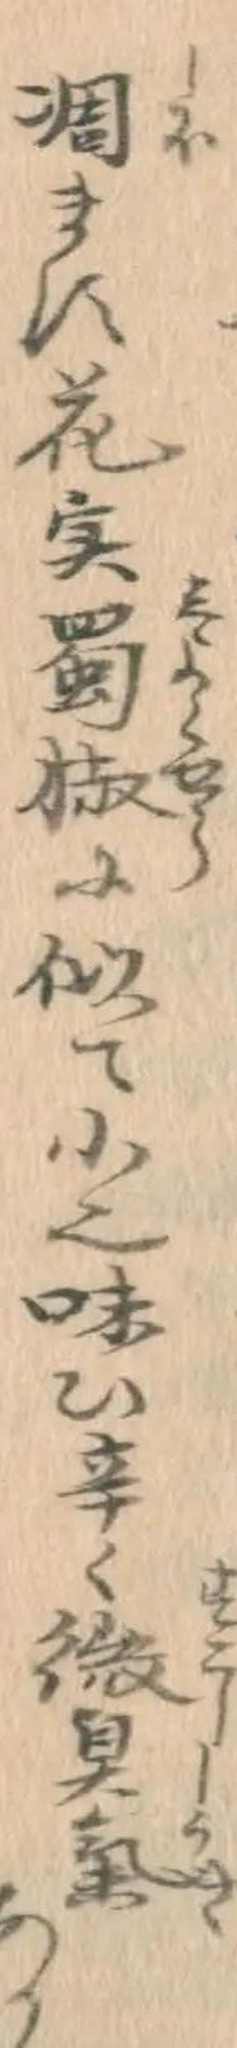凋ます花実蜀椒に似て小也味ひ辛く微臭気あり
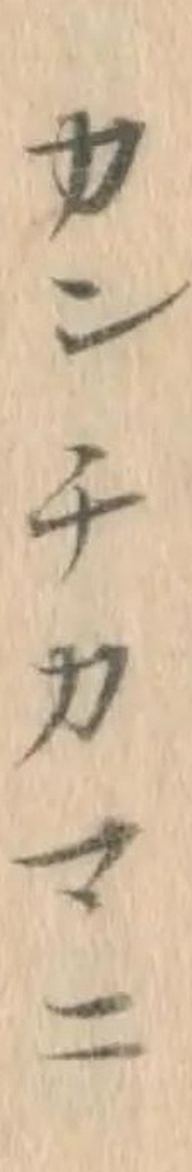カンチカマニ

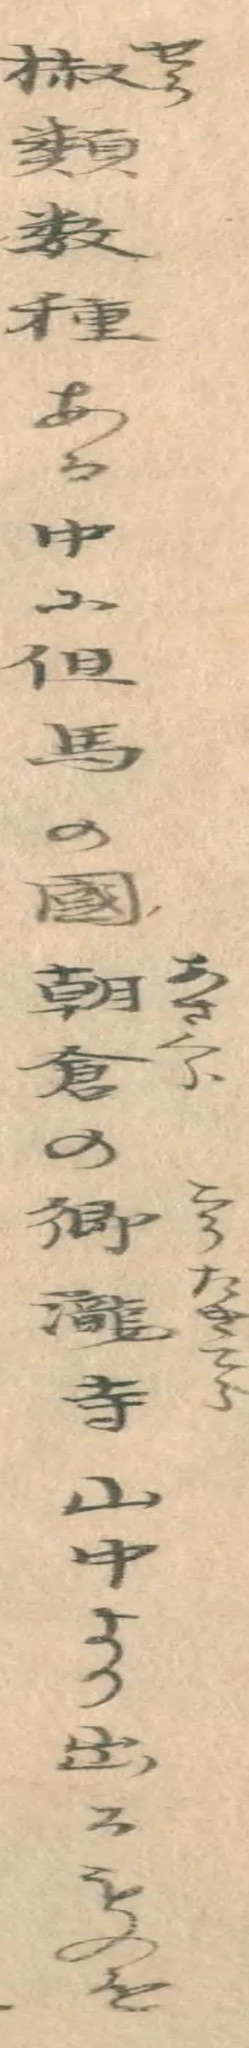椒類数種ある中に但馬の国朝倉の郷瀧寺山中より出るものを
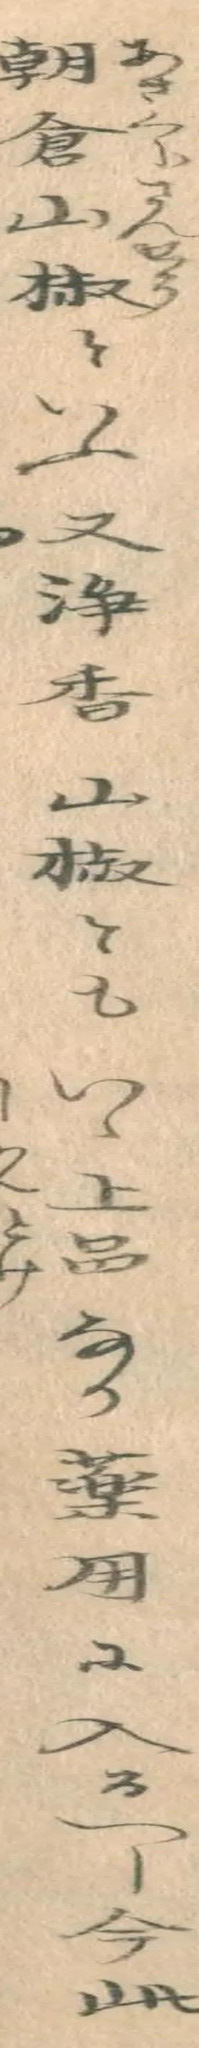朝倉山椒といふ又浄香山椒ともいゝ上品なり薬用に入るへし今此
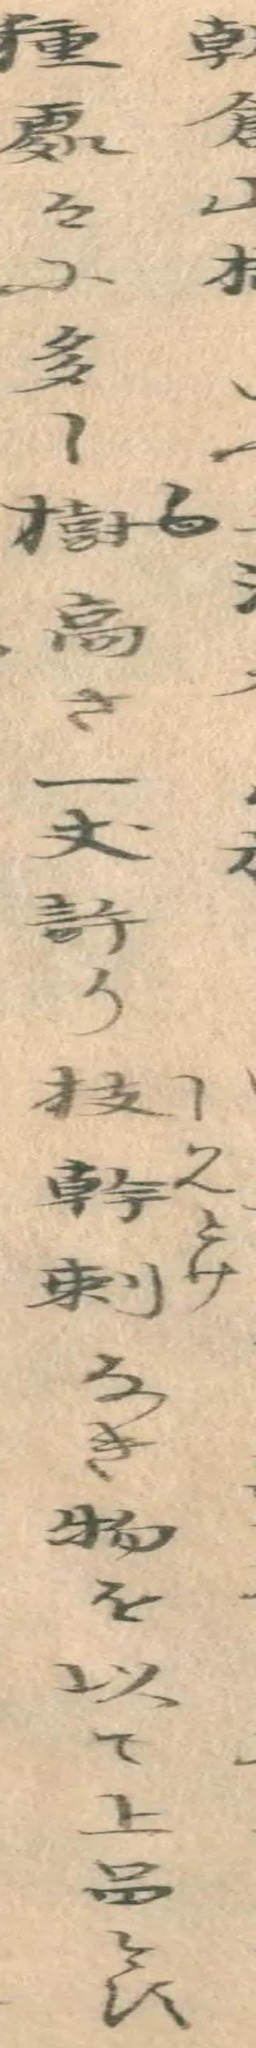種處々に多し樹高さ一丈計り枝幹刺なき物を以て上品とす
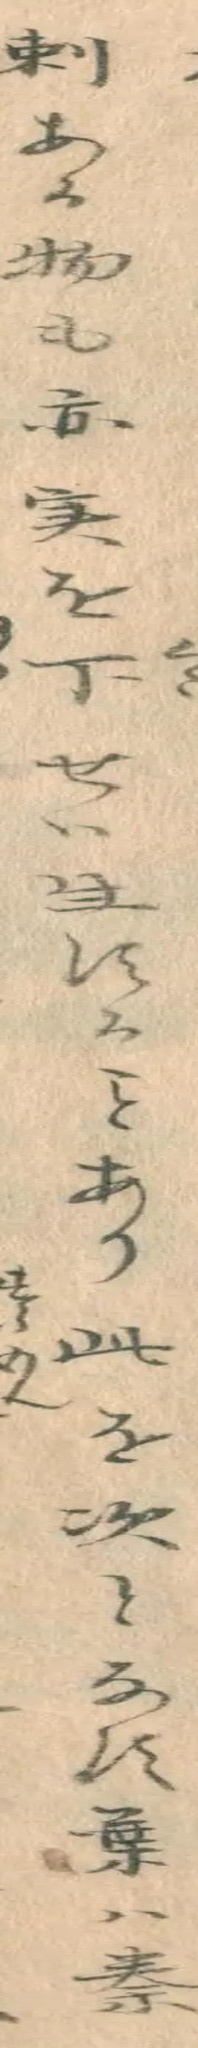刺ある物も亦実を下せい生することあり此を次となす葉ハ秦
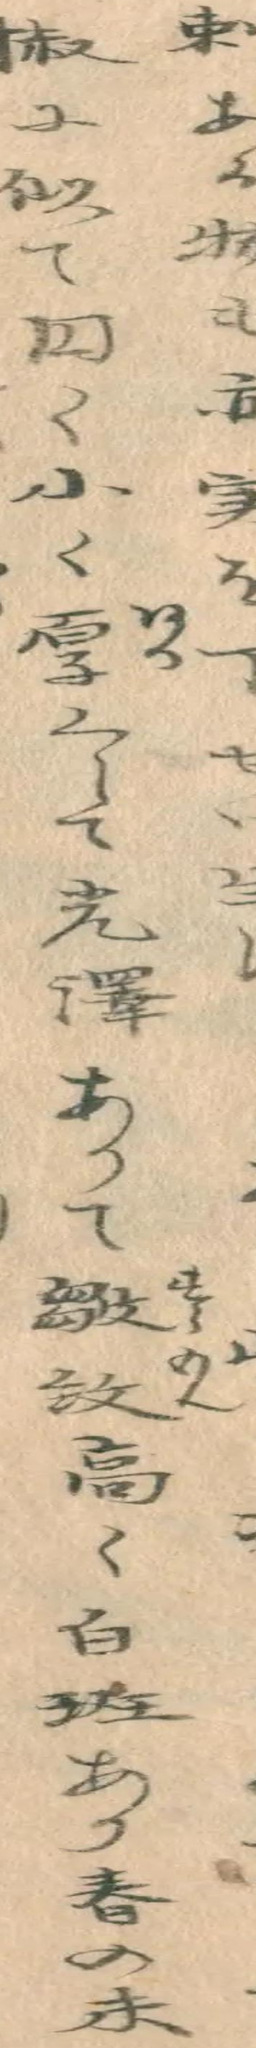椒に似て円く小く厚くして光沢ありて皺紋高く白班あり春の末
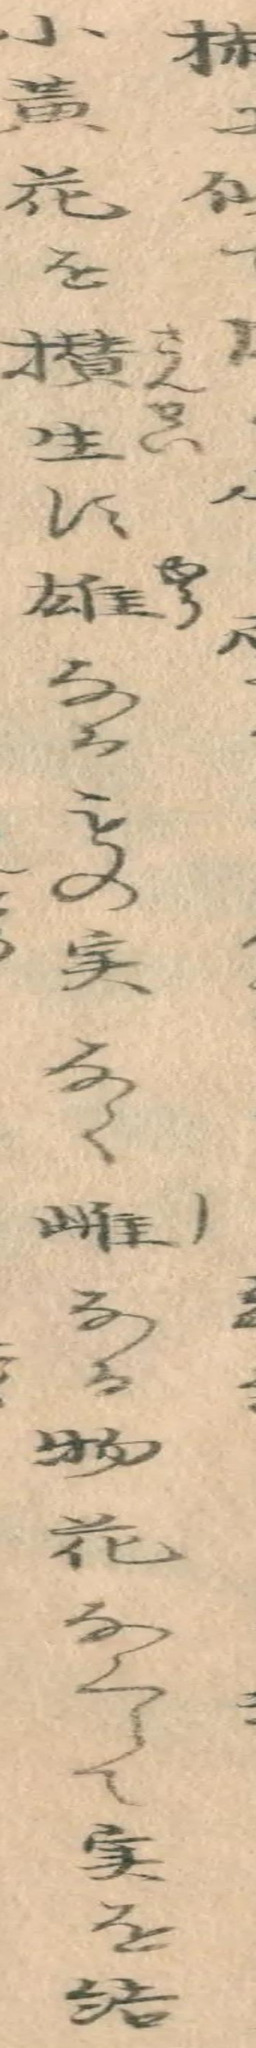小黄花を攅生す雄なることの実なく雌なる物花なくして実を結
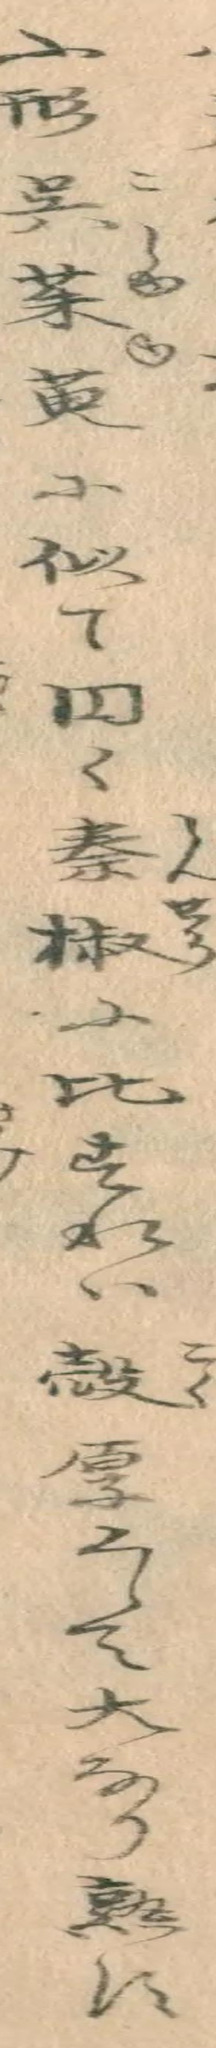ふ形呉茱莠に似て円く秦椒に比すれハ穀厚くして大なり熟す
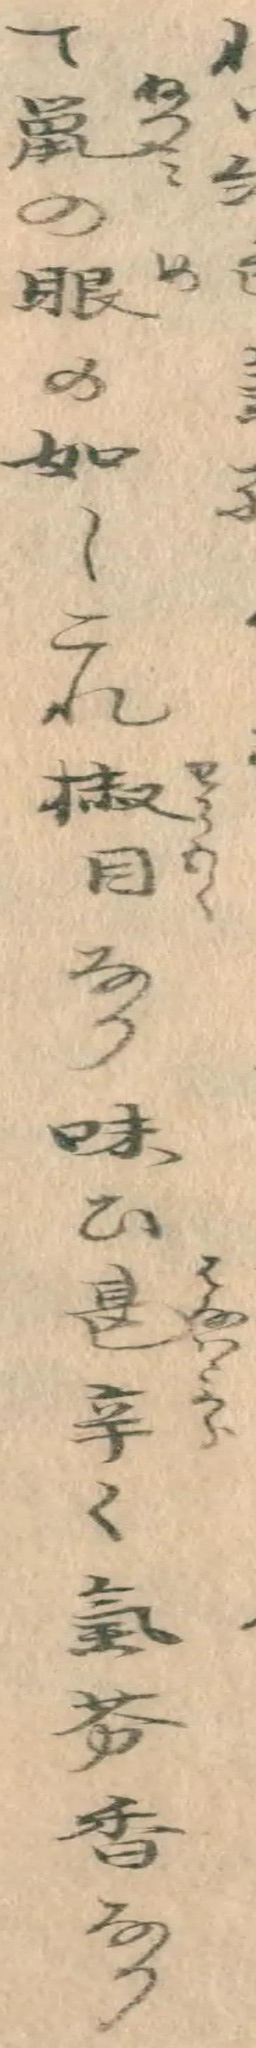て鼠の眼の如しこれ椒目なり味ひ甚辛く気芬香なり
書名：本草図譜. 巻70-72
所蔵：国立国会図書館 National Diet Library, JAPAN
